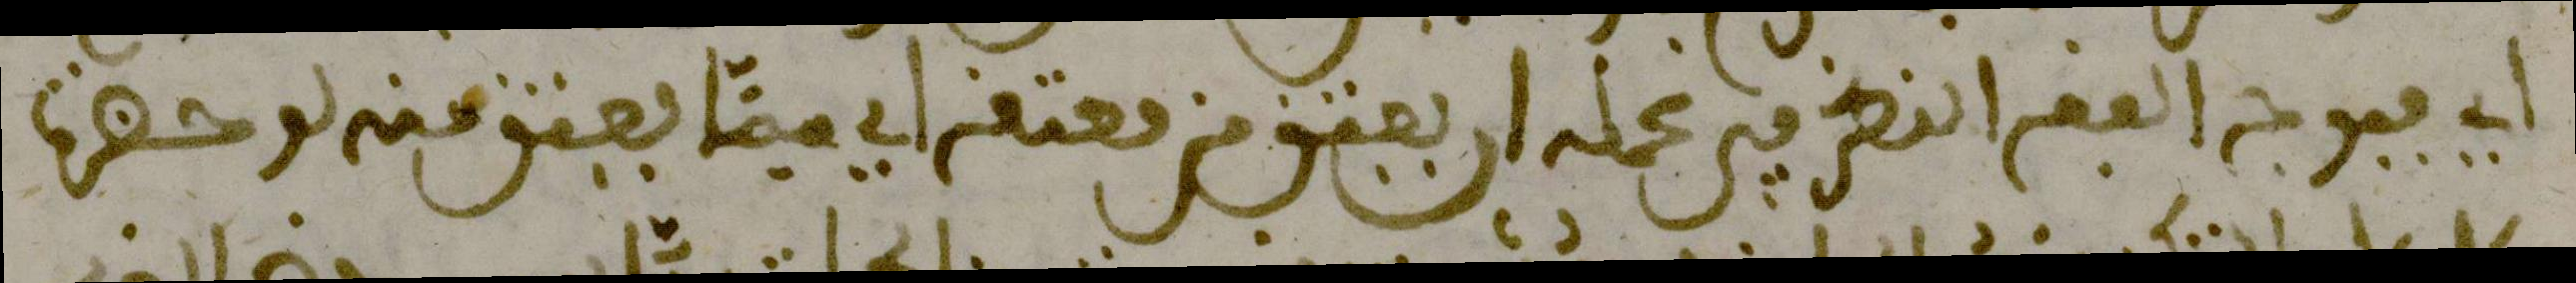اي فبوجه الفقه النظر في عمله ان يعتق من معتقه اي مِمَّا يعتق منه لو حضرت
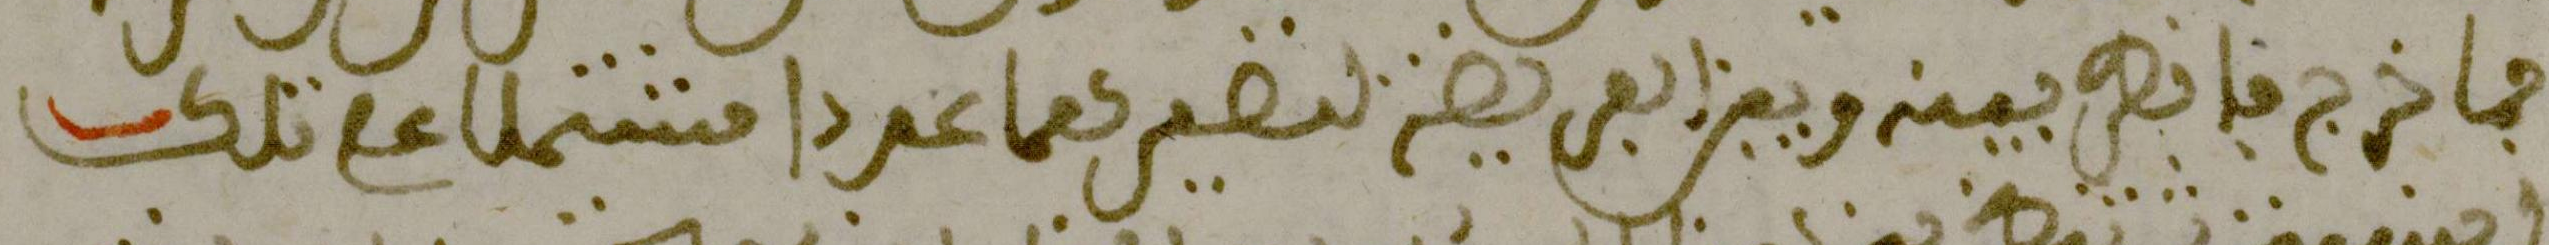فما خرج فانظر بينه وبين الفريضة لتصيرهما عددا مشتملا على تلكَ
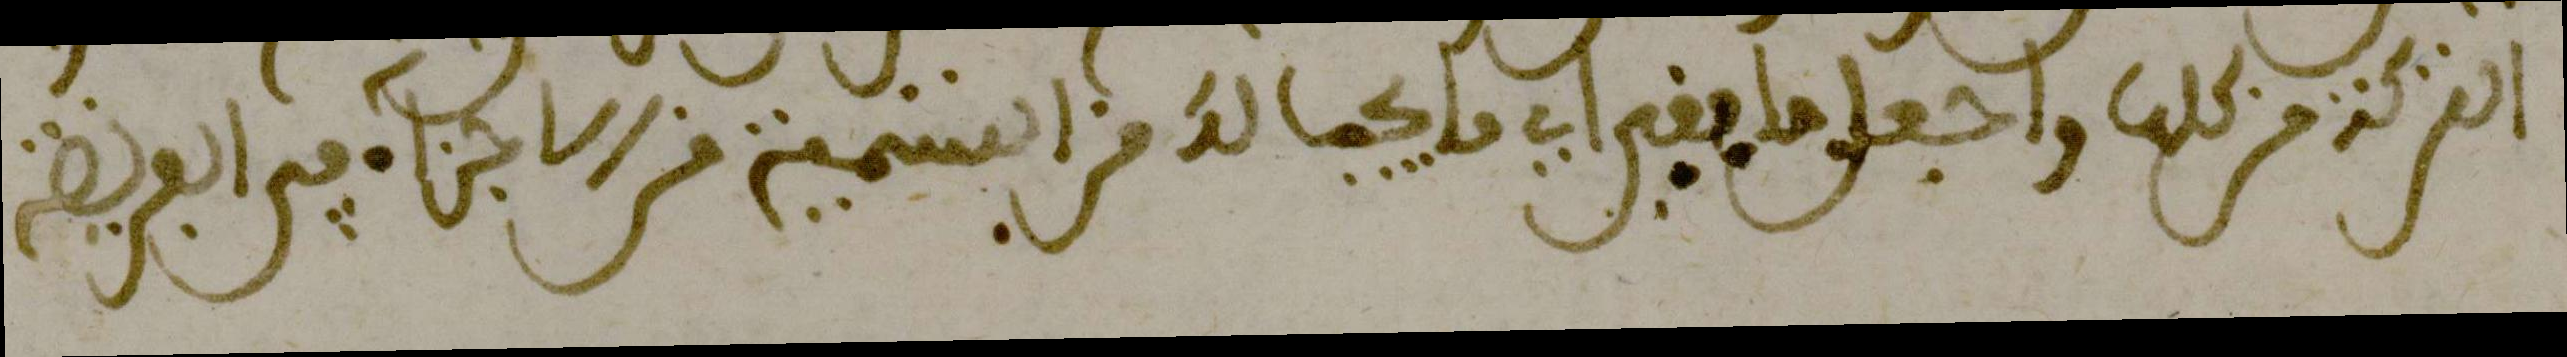التركة من كلها واجعل ما بقي اي ما يجا لك من التسمية من الاجزاء في الفريضة
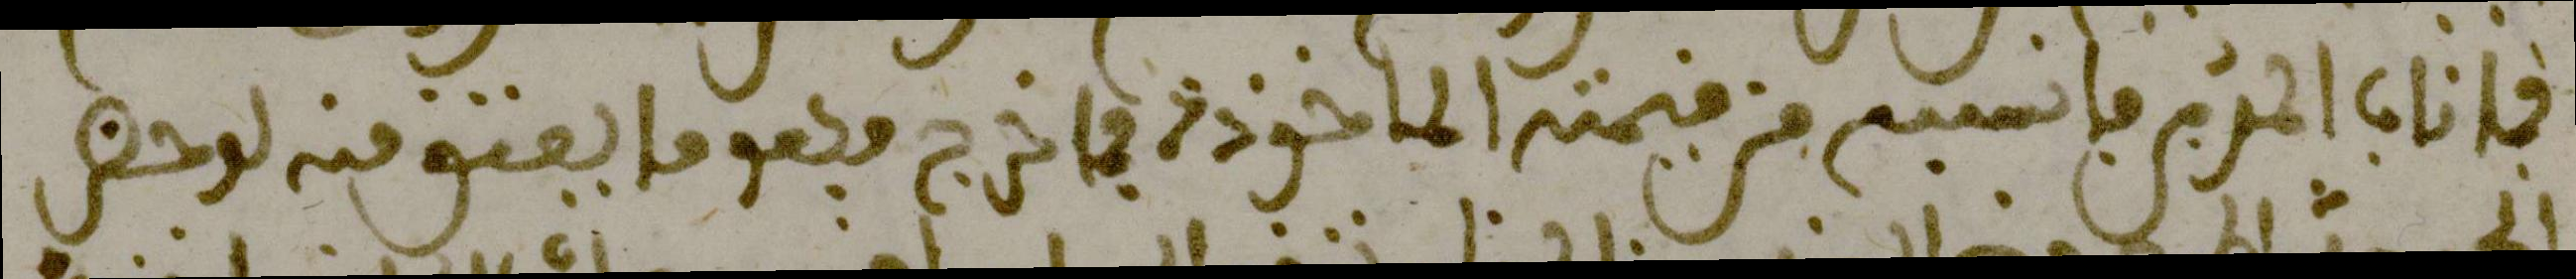فما نال المدبر فانسبه من قيمته الماخوذة فما خرج فهو ما يعتق منه لو حضر
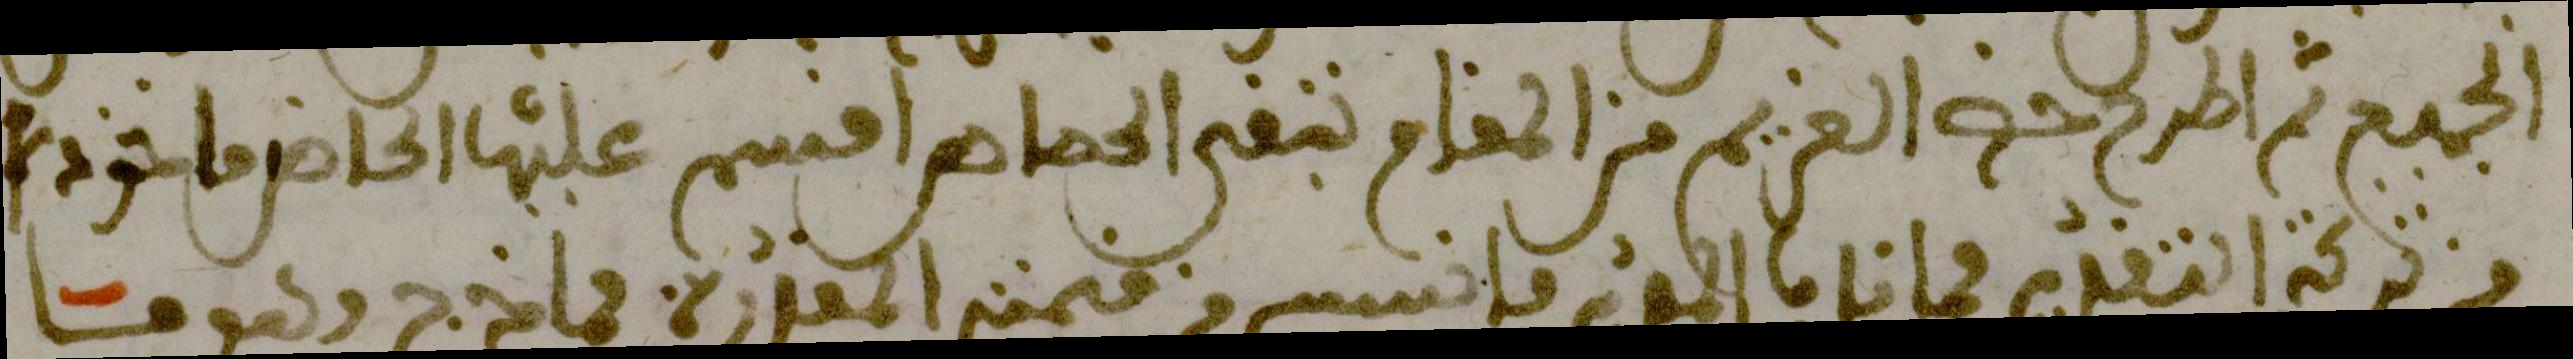الجميع ثم اطرح حض الغريم من المقام تبقى الحصاص اقسم عليْها الحاضر ماخوذا
